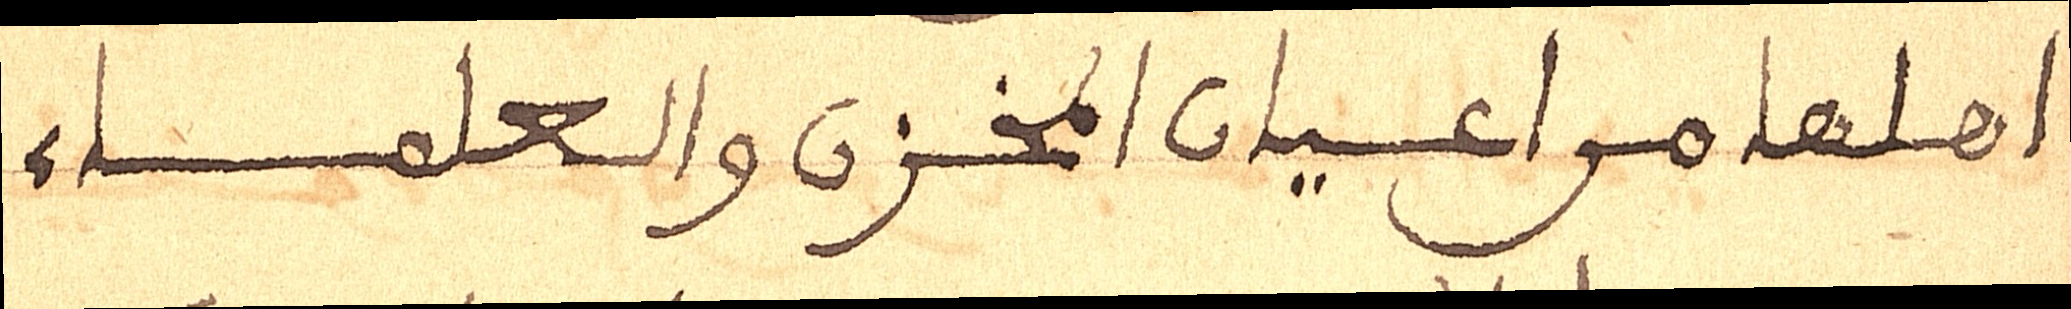اهلها من اعيان المخزن والعلماء
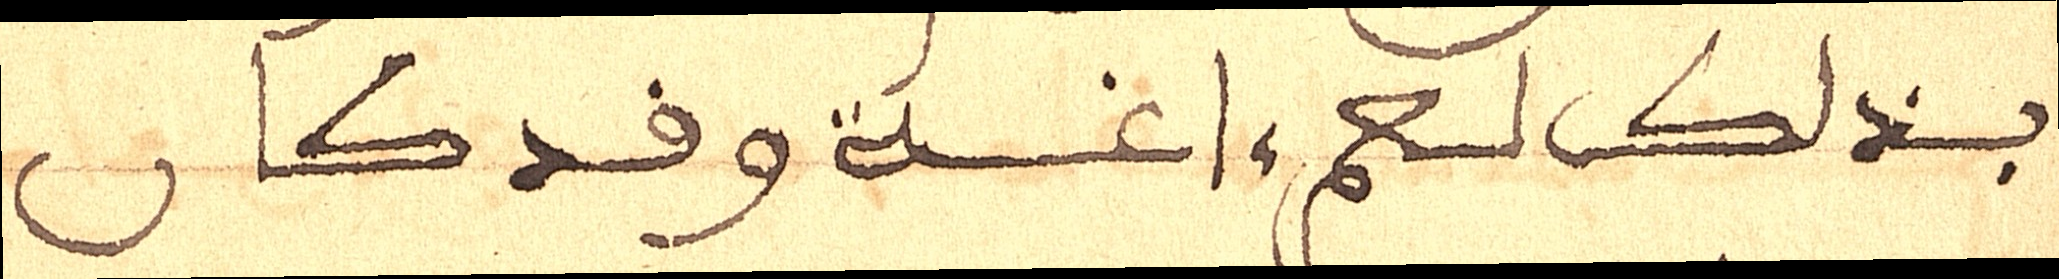بذلك لعمر ءاغة وقد كان
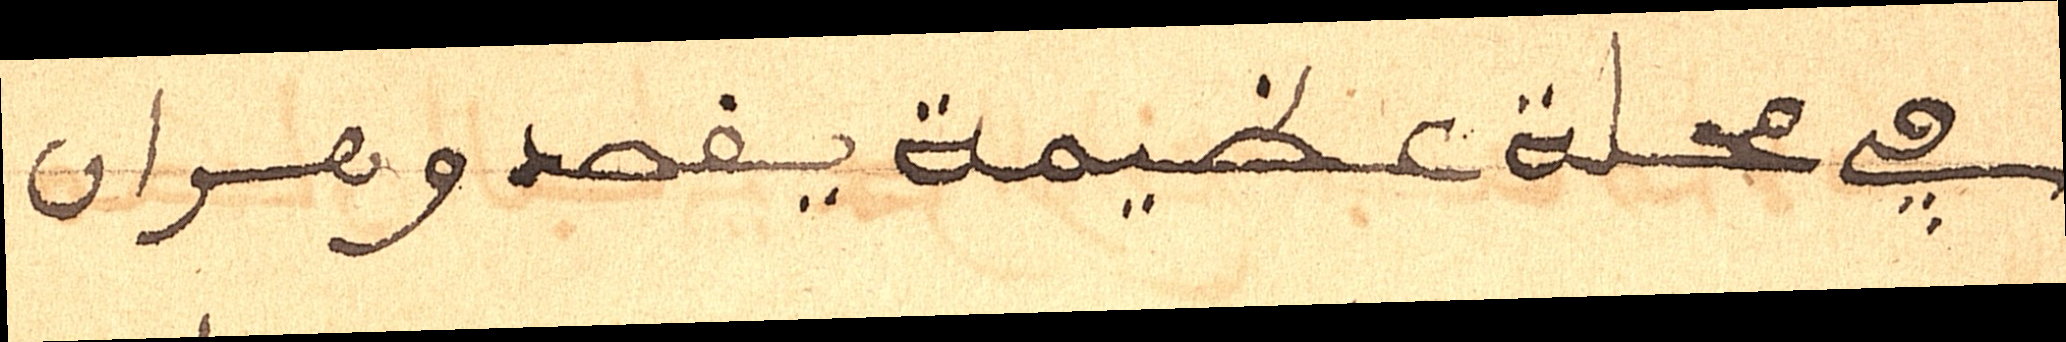في محلة عظيمة يقصد وهران
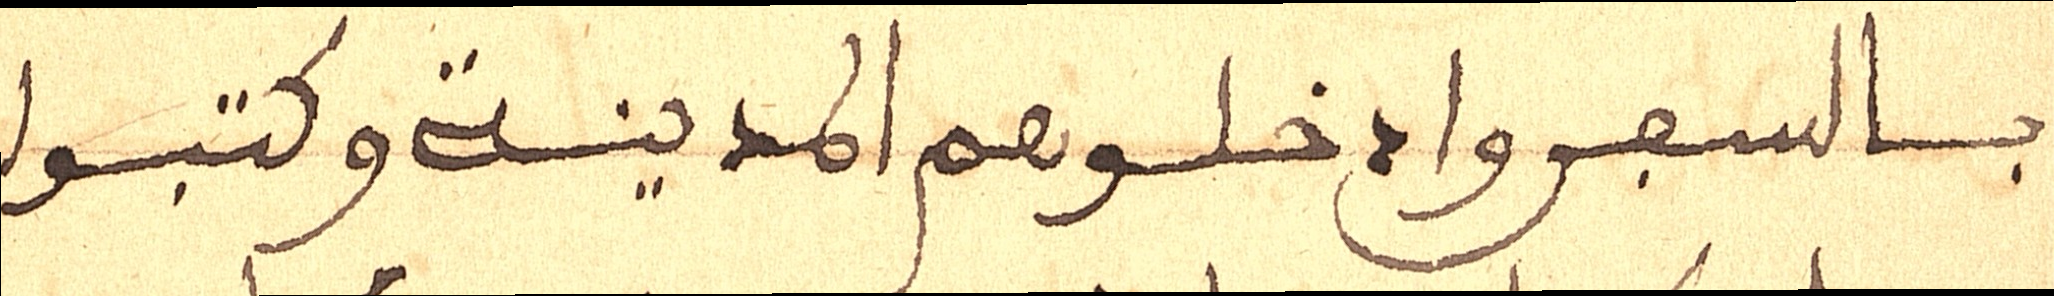بالسفن وادخلوهم المدينة وكتبوا
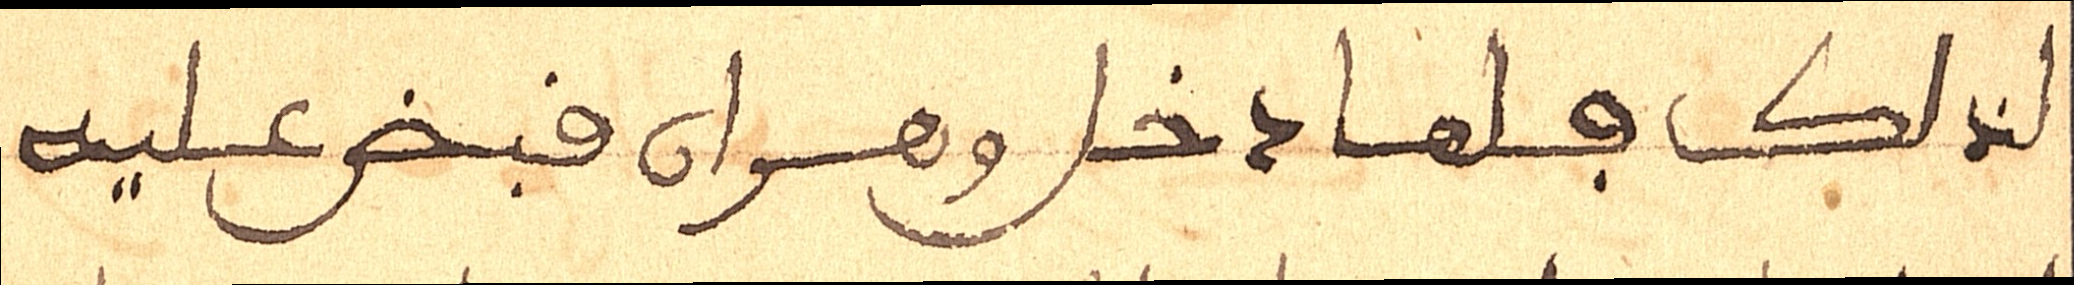لذلك فلما دخل وهران قبض عليه
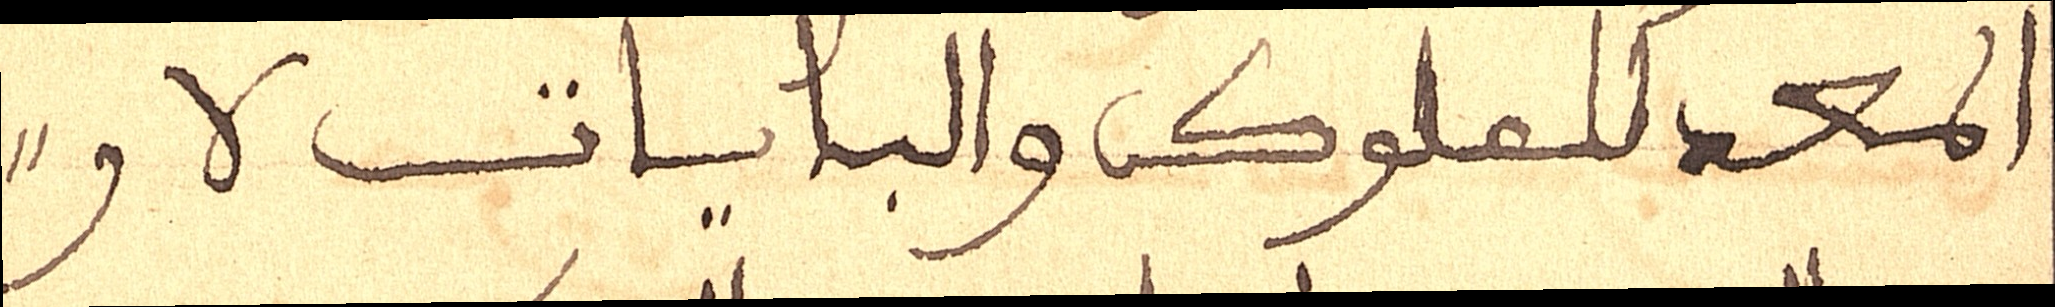المعد للملوك والبايات لا و
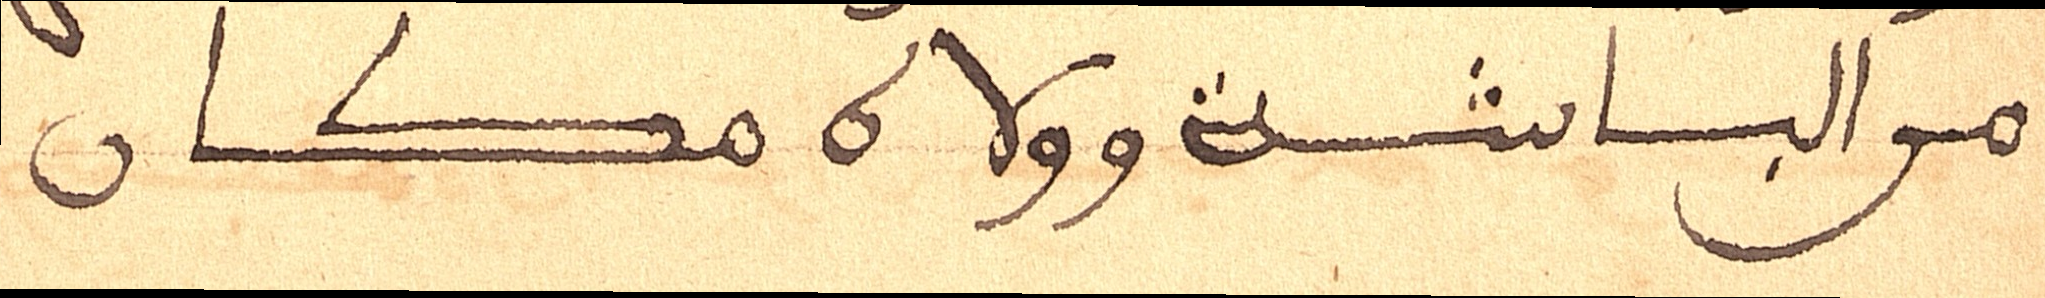من الباشة و ولاه مكان
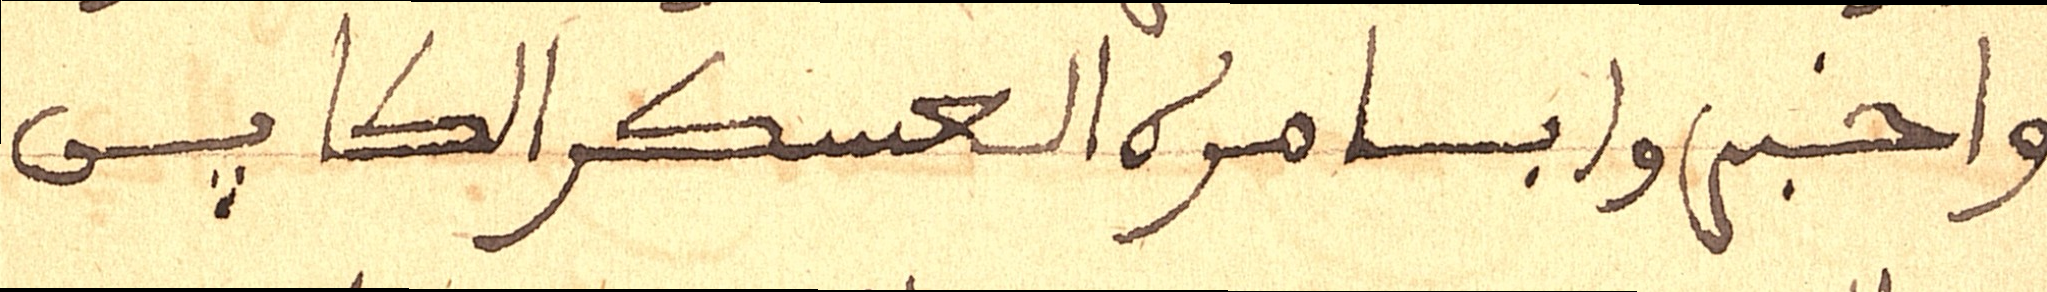واخبروا بامره العسكر الكائن
